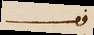قف
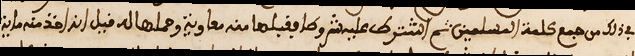في ذلك من جمع كلمة المسلمين ثم اشترط عليه شروطا فقبلها منه معاوية وحملها له قيل انه اخذ منه ماية
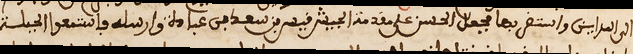الى المداين واستقر بها فجعل الحسن على مقدمة الجيش قيس بن سعد بن عبادة وارسله فاستمعوا الحيلة
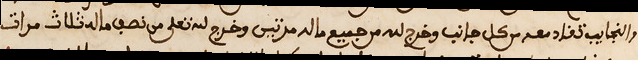النجايب تقاد معه من كل جانب وخرج لله من جميع ماله مرتين وخرج لله تعلى من نصب ماله ثلاث مرات
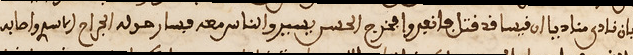بان نادى مناديا ان قيسا قد قتل فانفروا فخرج الحسن يسير والناس معه فسار حوله الجراح الاسدى واصابه
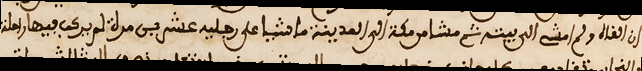ان القاه ولم امشى الى بيته ثم مشا من مكة الى المدينة ما شيا على رجليه عشر بن مرة لم يركب فيها راحلة
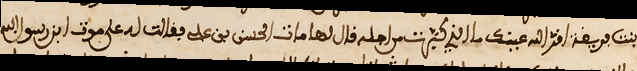بنت فريضة اقر الله عينك ما الذي كبرت من اجله قال لها مات الحسن بن على فقالت له على موت ابن رسول الله
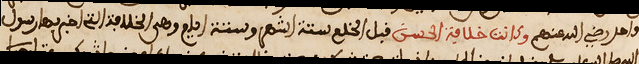واحد رضي الله عنهم وكانت خلافة الحسن قبل الخلع ستة اشهر وستة ايام وهى الخلافة التي اخبر بها رسول
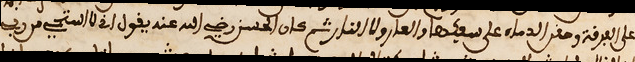على الفرقة وحقن الدماء على سفكها والعار ولا النار ثم كان الحسن رضي الله عنه يقول انى لا استحي من ربى
